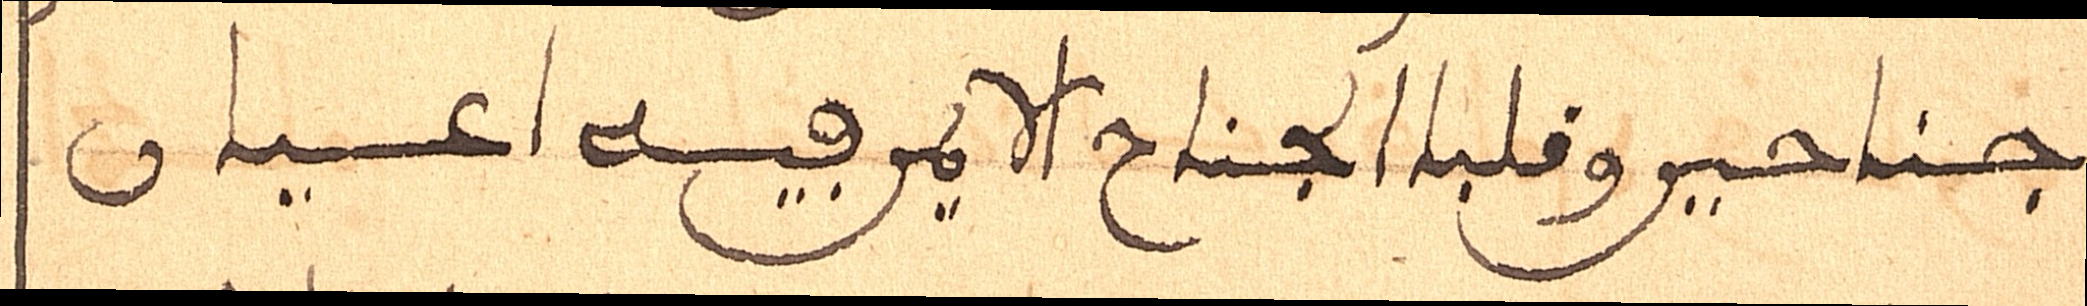جناحين وقلبا الجناح الايمن فيه اعيان
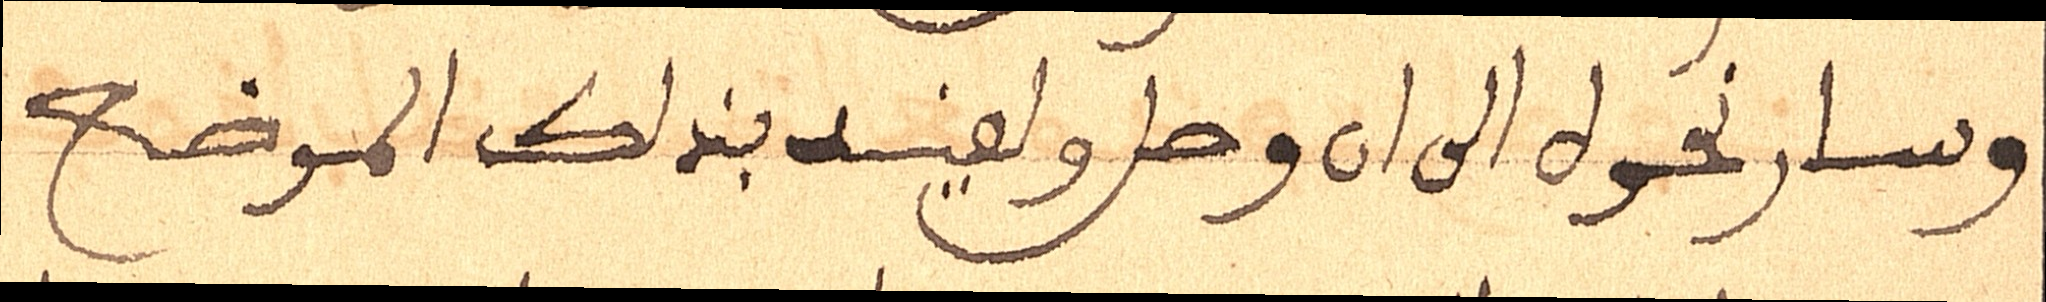وسار نحوه الى ان وصل ولقيه بذلك الموضع
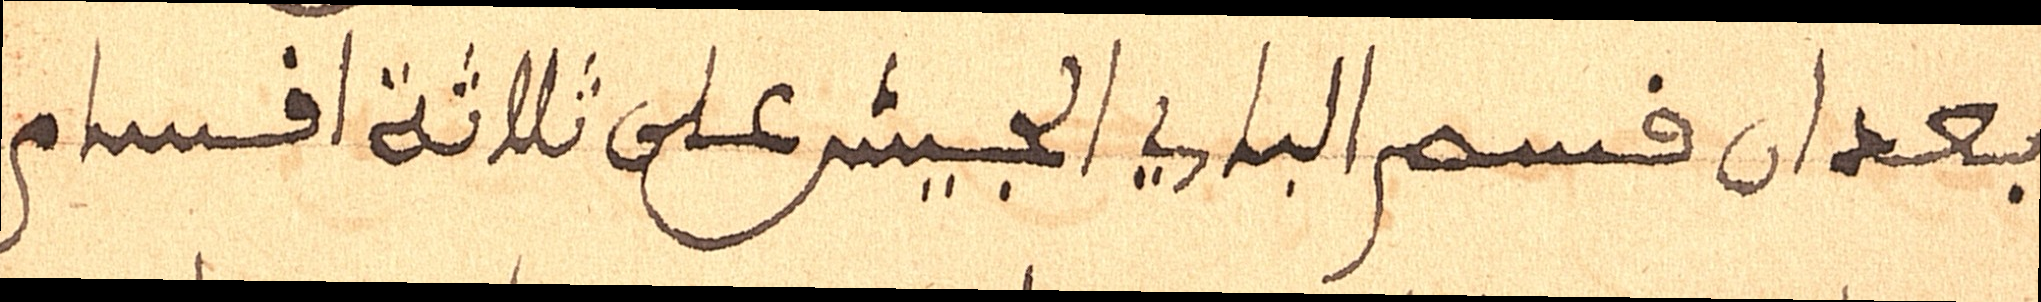بعدان قسم الباي الجيش على ثلاثة اقسام
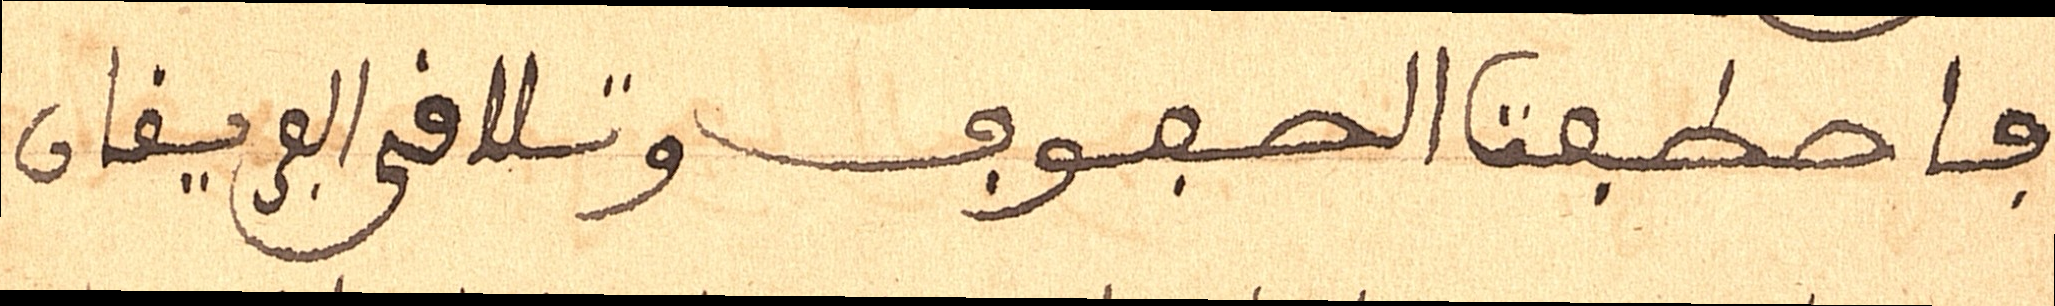فاصطفت الصفوف وتلاقى الفريقان
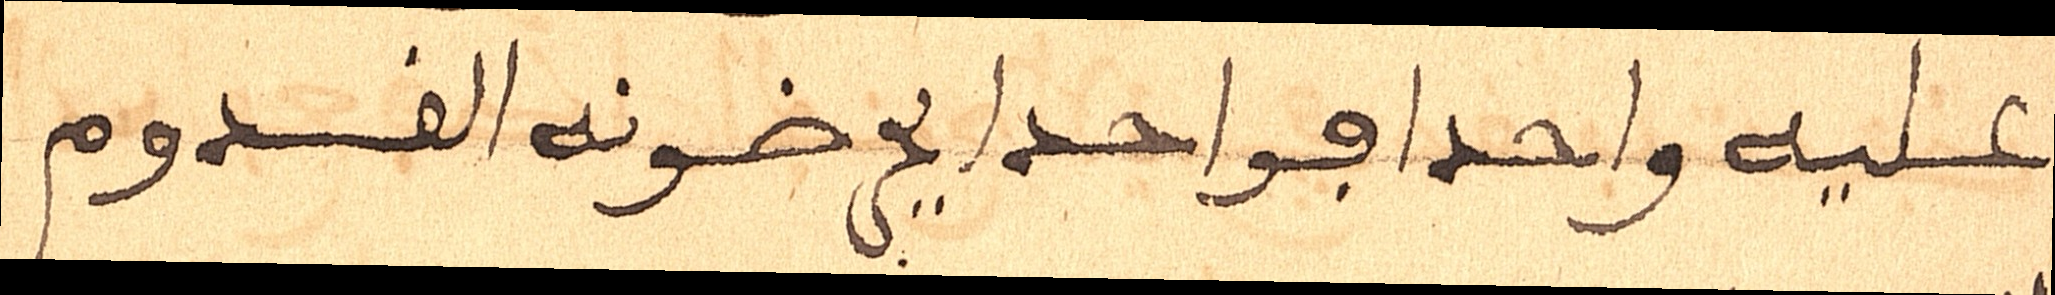عليه واحدا فواحدا يحرضونه القدوم
